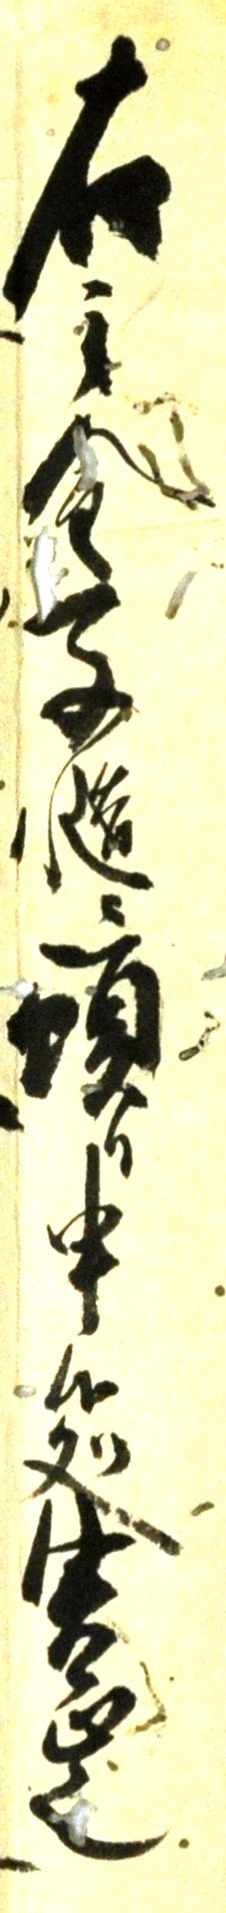右之金子慥ニ預り申候処実正也
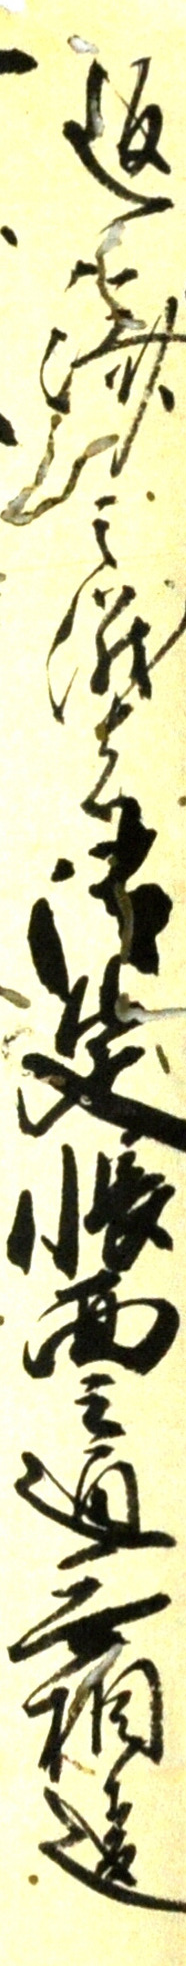返済之儀者御定帳面之通無相違
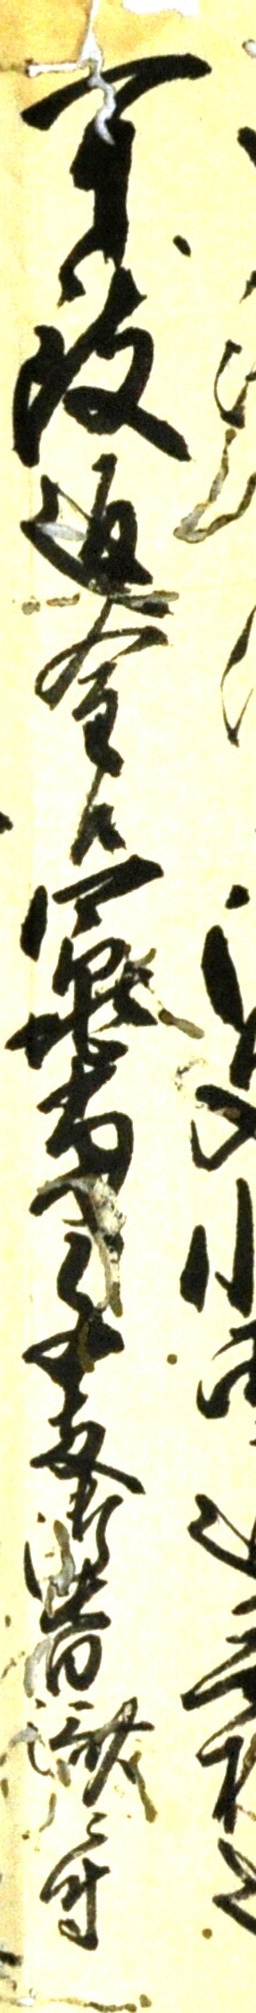可致返金候鬮当千両御皆済ニ付
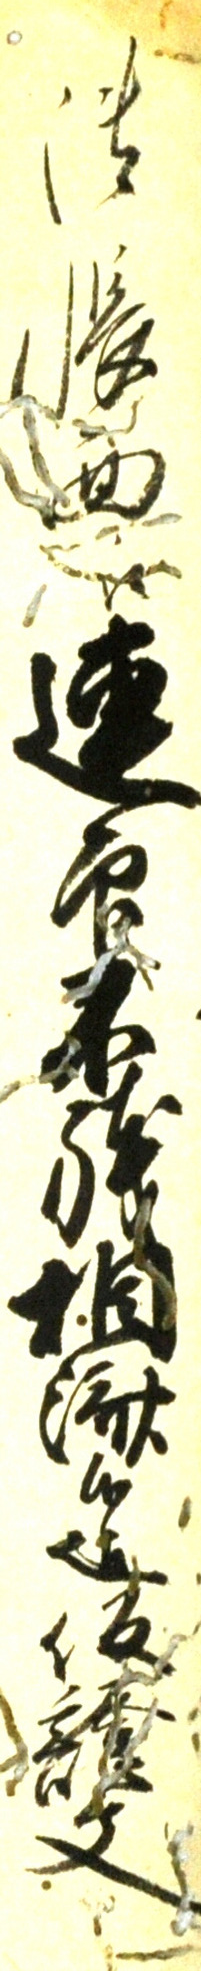御帳面江連印不残相済候迄仮證文
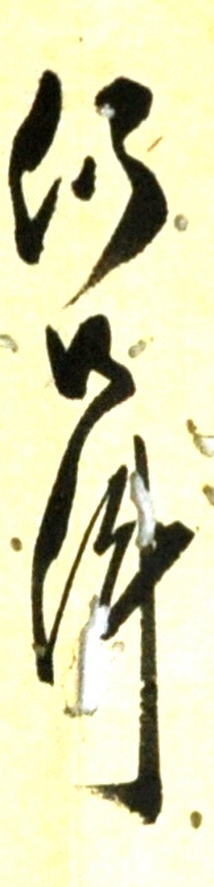仍如件
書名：預り申金子之事
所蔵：伊那市立高遠町図書館・合同会社AMANE
